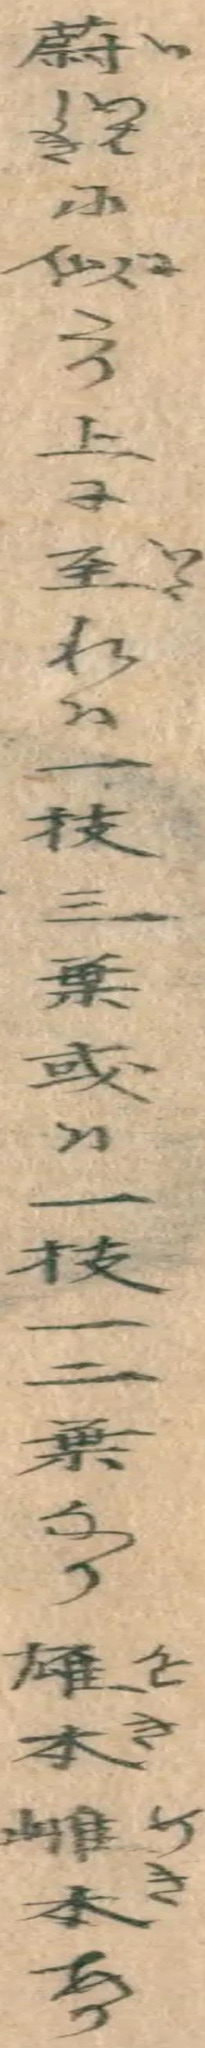蔚めはしきに似たり上に至れは一枝三葉或は一枝一二葉なり雄本雌本あり
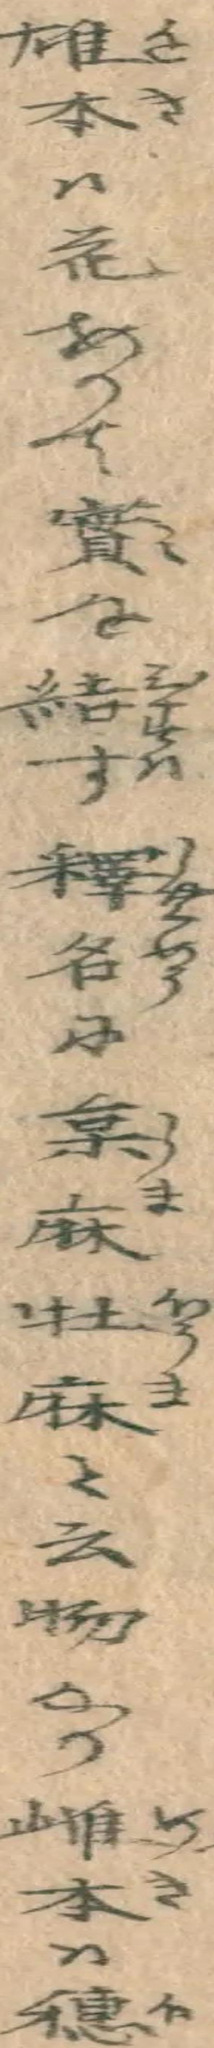雄本は花ありて実を結す釈名に枲麻牡麻と云物なり雌本は穂
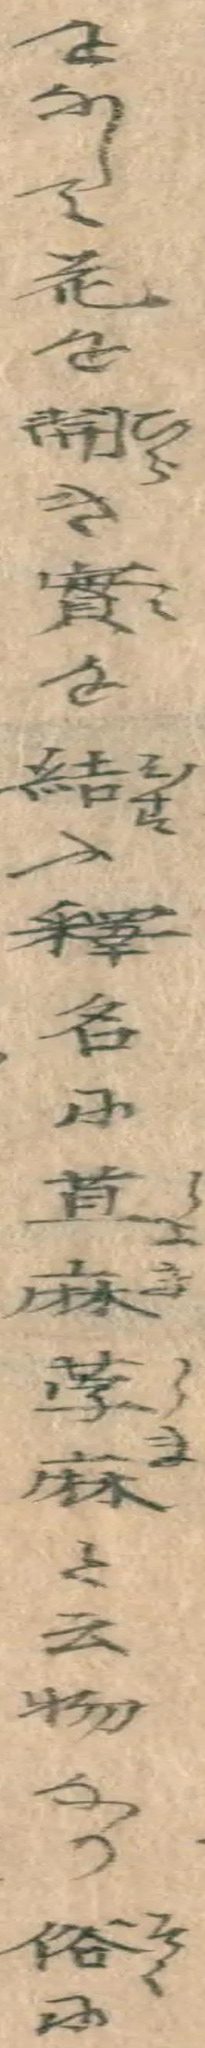をなして花を開き実を結ふ釈名に苴麻茡麻と云物なり俗に
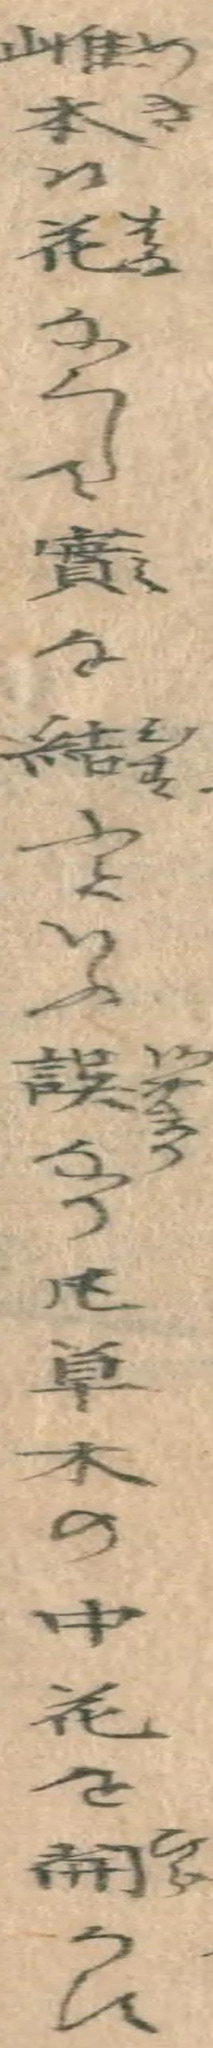雌本は花なくして実を結ふといふ誤なり凡草木の中花を開かす
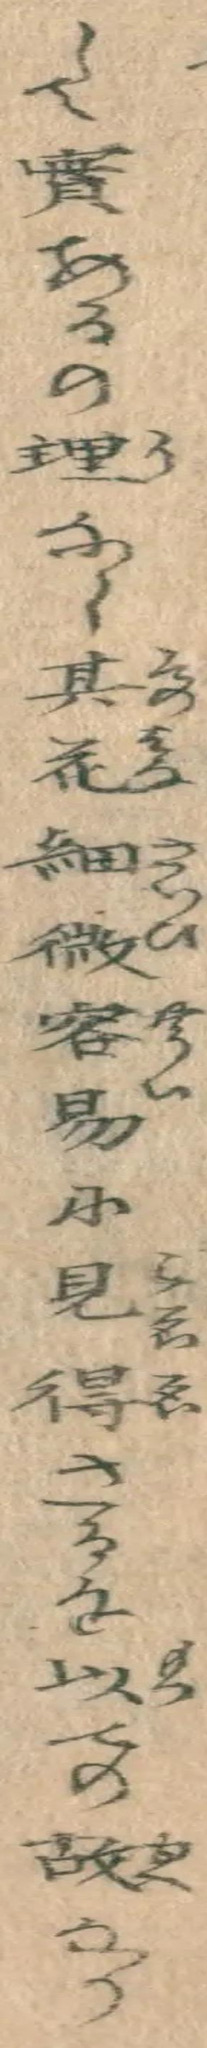して実あるの理なし其花細微容易に見得さるを以ての故なり

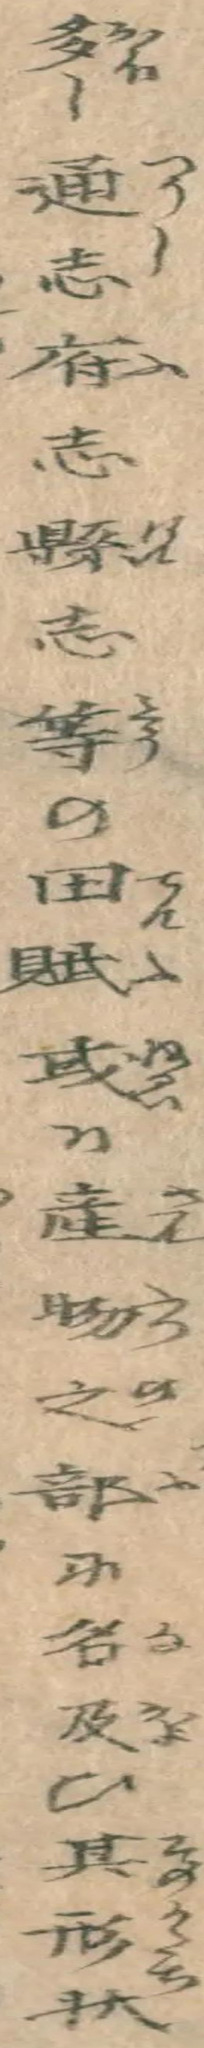多し通志府志県志等の田賦或は産物之部に名及ひ其形状
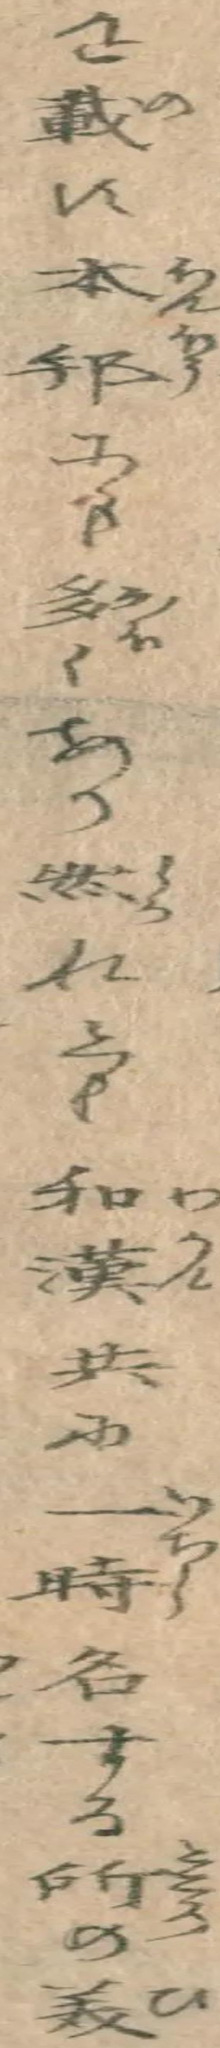を載す本邦にも多くあり然れとも和漢共に一時名する所の美
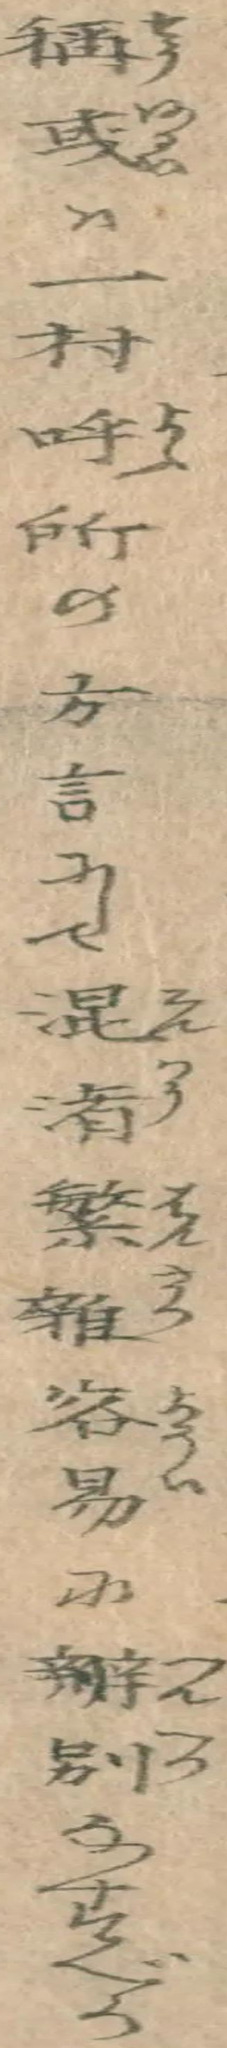称或は一村呼所の方言にして混淆繁雑容易に弁別なすべか
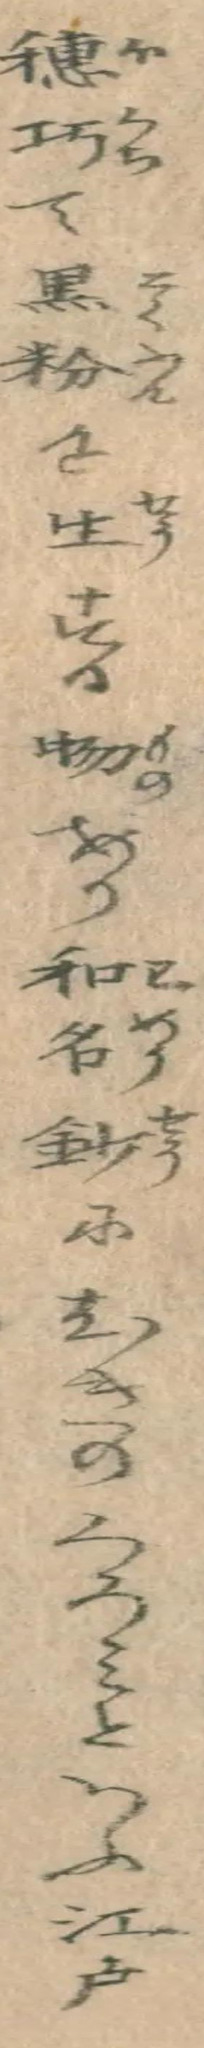穂巧て黒粉を生する物あり和名鈔にむきのくろみといふ江戸
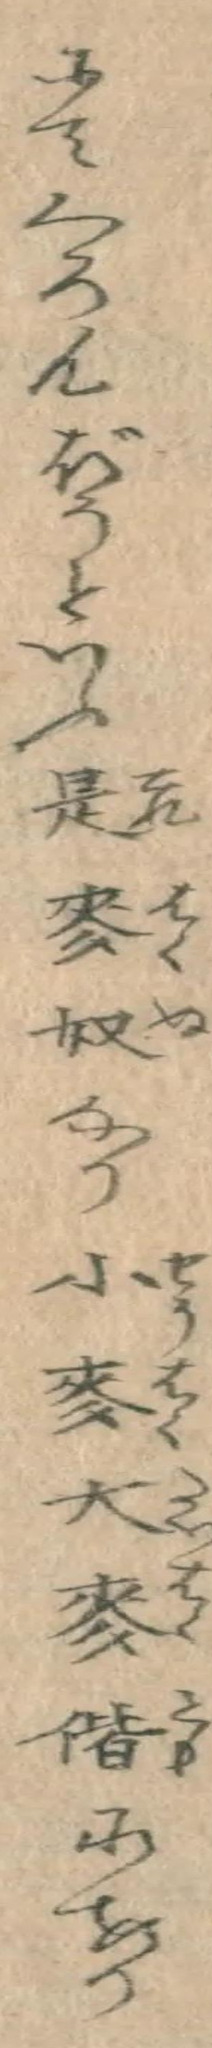にてくろんぼうといふ是麦奴なり小麦大麦偕にあり
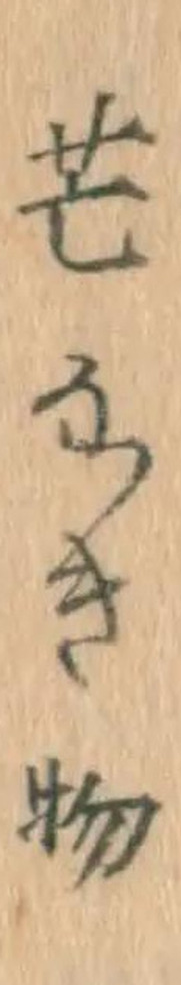芒なき物
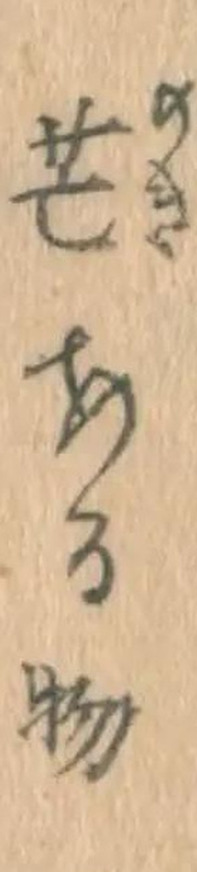芒ある物
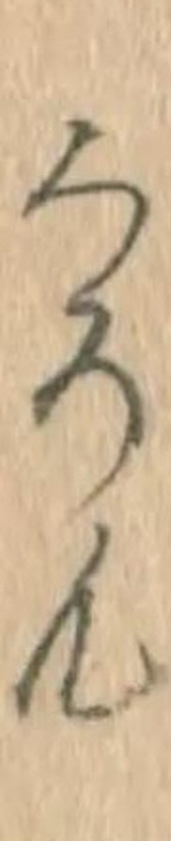くろん

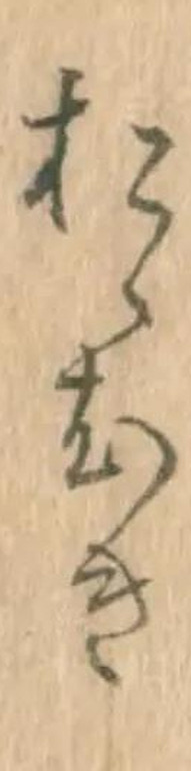おゝむき
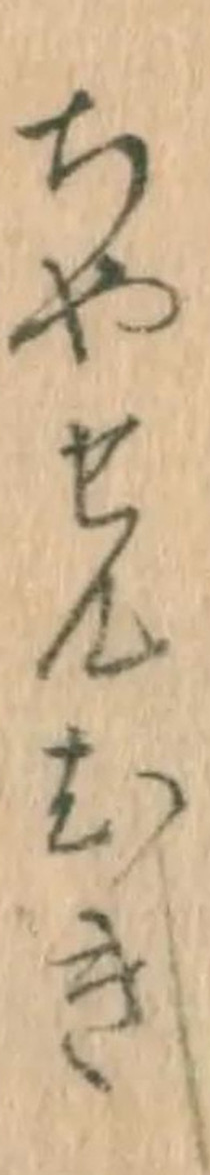ちやせんむき
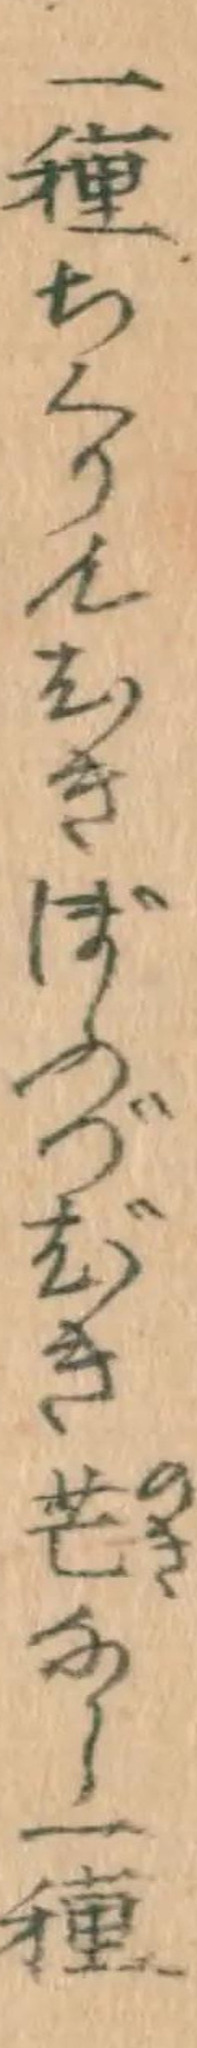一種ちくりんむきぼふづむき芒なし一種
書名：本草図譜. 巻40-42
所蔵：国立国会図書館 National Diet Library, JAPAN
